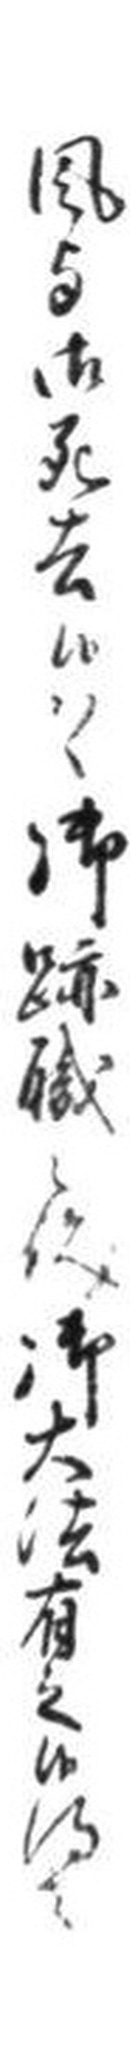風と御死去候ハヽ御跡職之儀御大法有之候得者
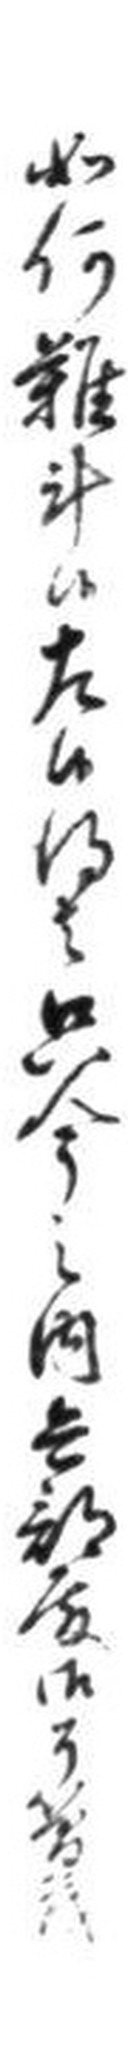如何難計候左候得者只今之内兵部殿御了簡も
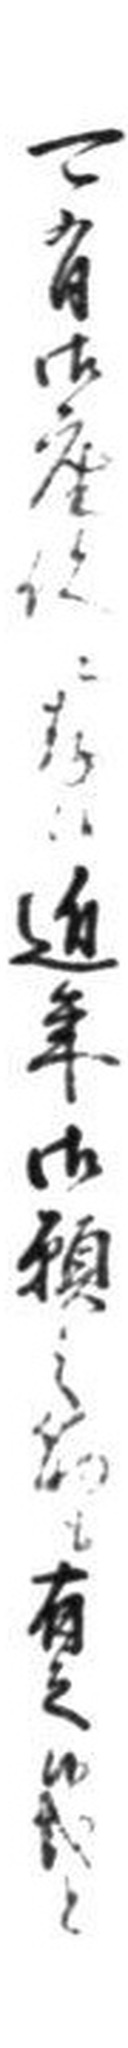可有御座儀ニ存候近年御願之筋も有之候哉と
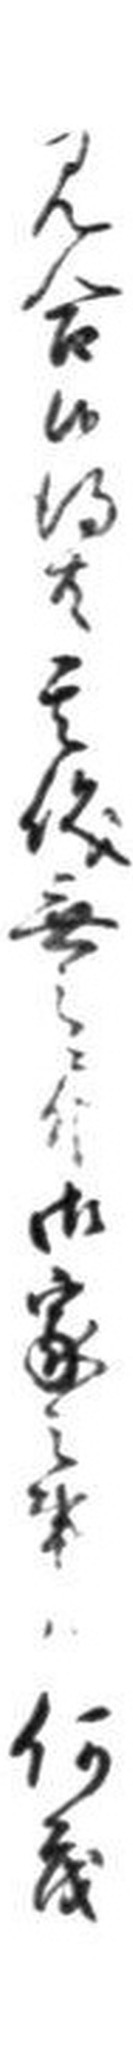見合候得共其儀無之ニ付御家之事ハ何も
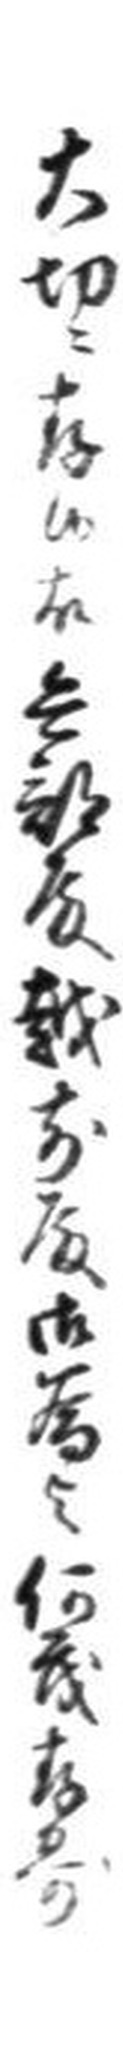大切ニ存候故兵部殿越前殿御為と何も存寄
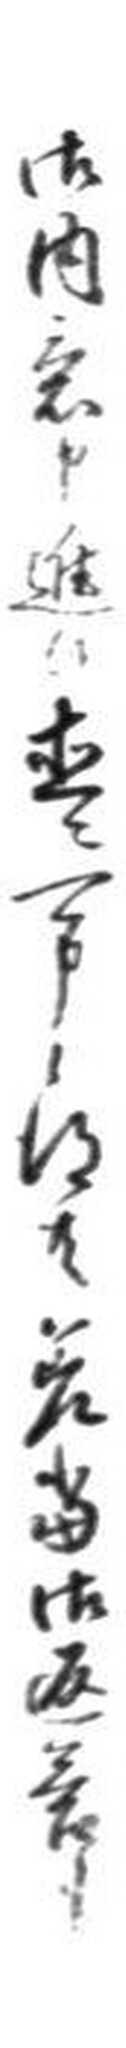御内意申進候直ニ可申候得共差当御返答も
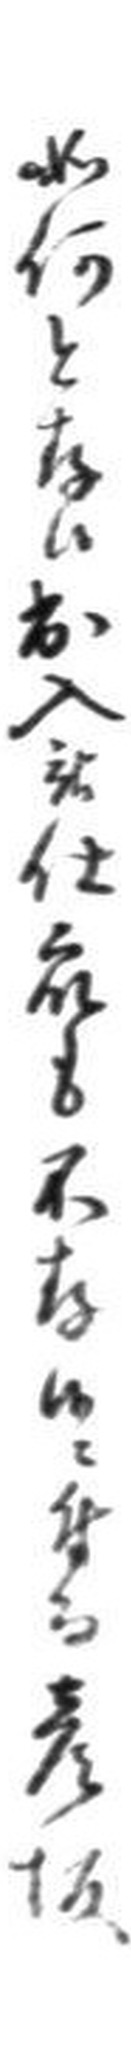如何と存候出入被仕衆も不存候ニ付而彦坂
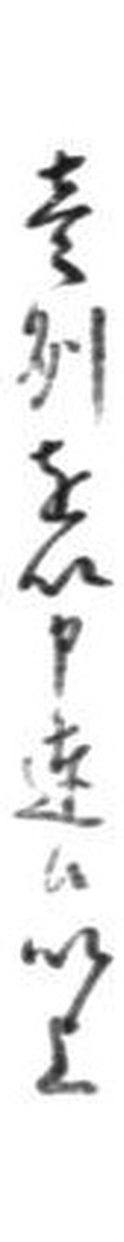壱州を以申達候以上
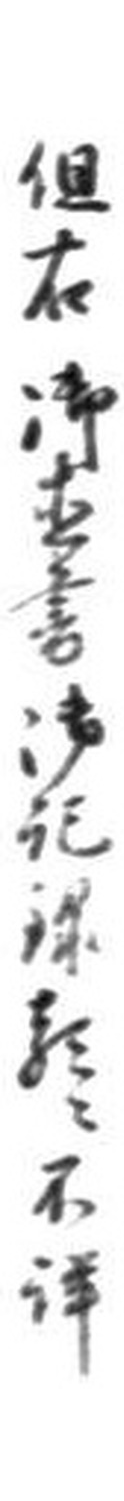但御直書御記録類ニ不詳
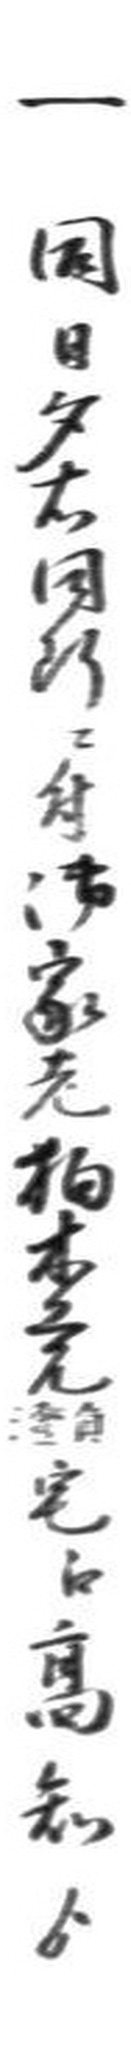一同日夕同断ニ付御家老狛木工允貞澄宅江高知ゟ
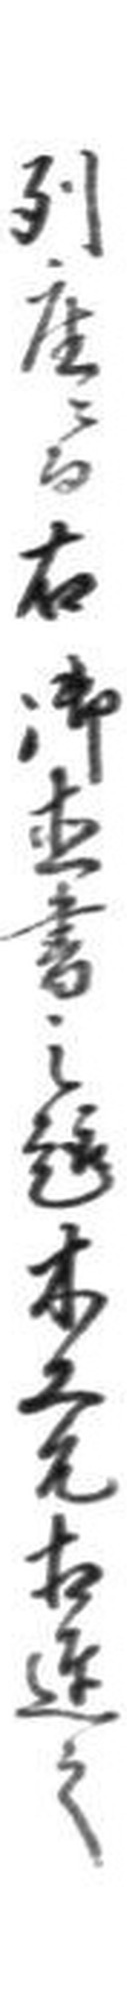列座ニ而右御直書之趣木工允相達之
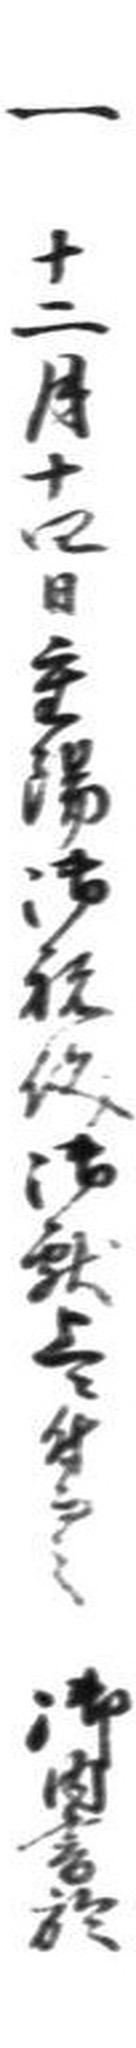一十二月十四日重陽御祝儀御献上ニ付而之御内書於

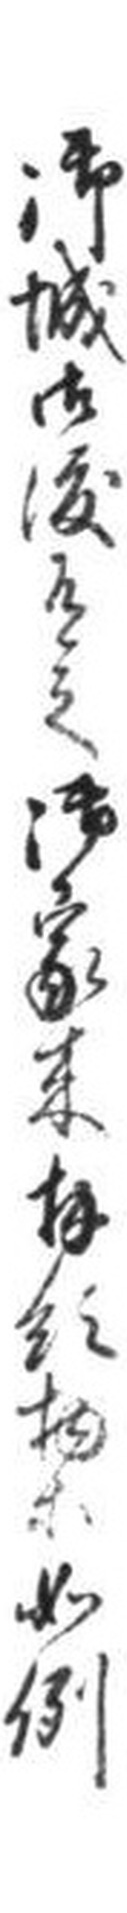御城御渡有之御家来拝領物等如例
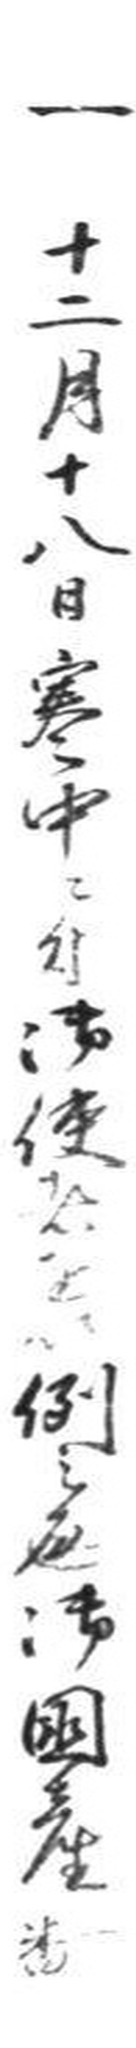一十二月十八日寒中ニ付御使者を以例之通御国産一番
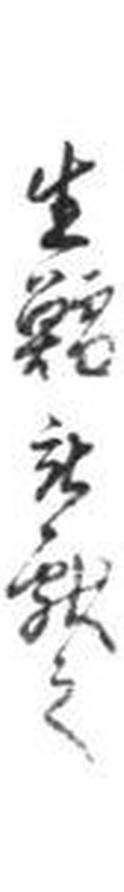生鱈被献之
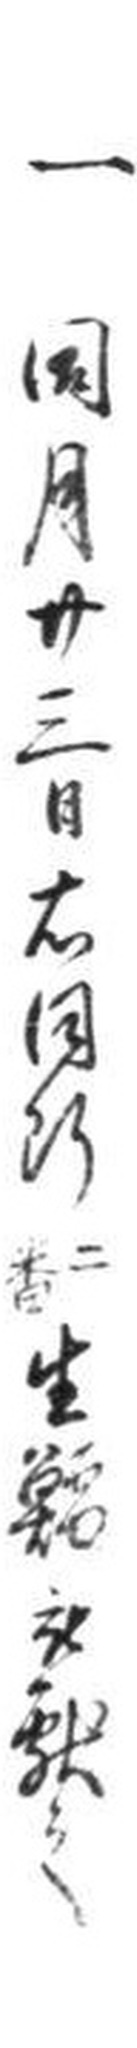一同月廿三日右同断二番生鱈被献之
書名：家譜 十五 綱昌公 従天和元年到元禄十二年
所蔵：福井県文書館 Fukui Prefectural Archives
